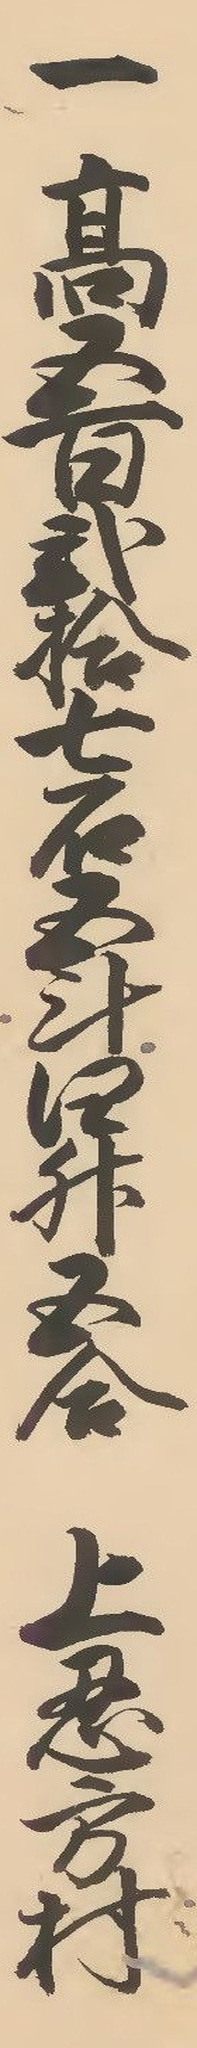一高五百弐拾七石五斗四升五合上恩方村

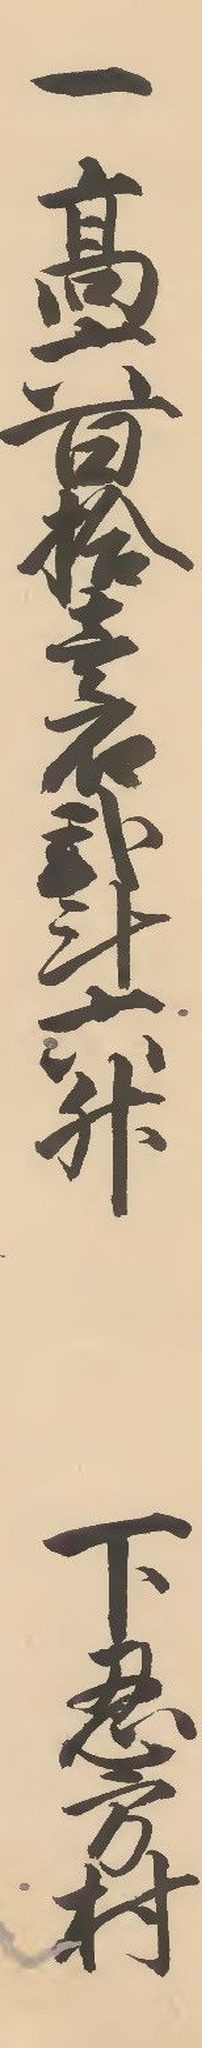一高六百拾壱石弐斗六升下恩方村
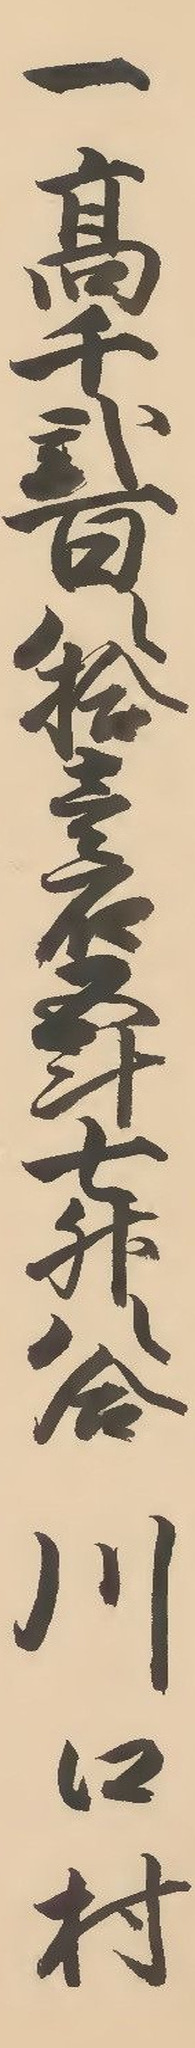一高千弐百八拾壱石五斗七升八合川口村
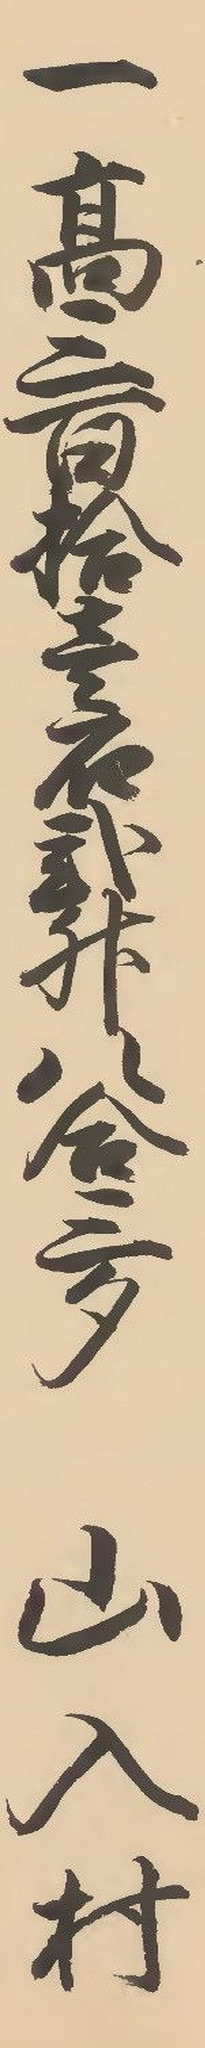一高三百拾壱石弐升八合三勺山入村
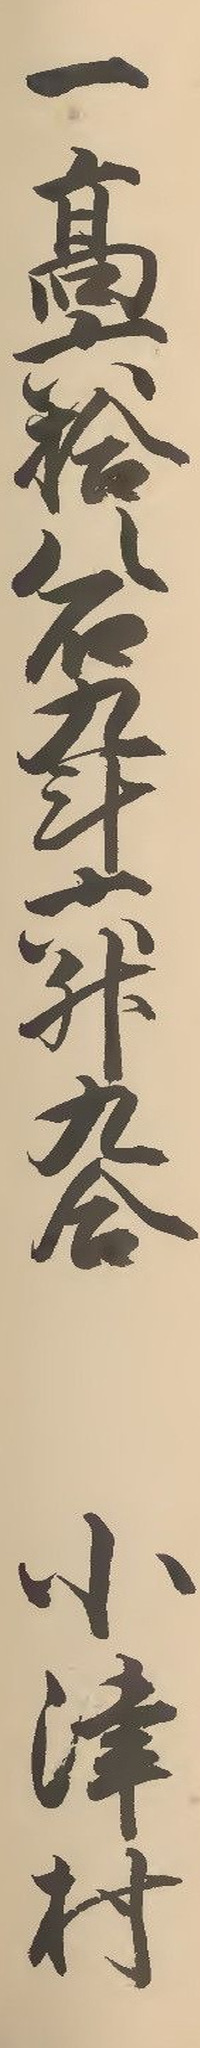一高六拾八石九斗六升九合小津村
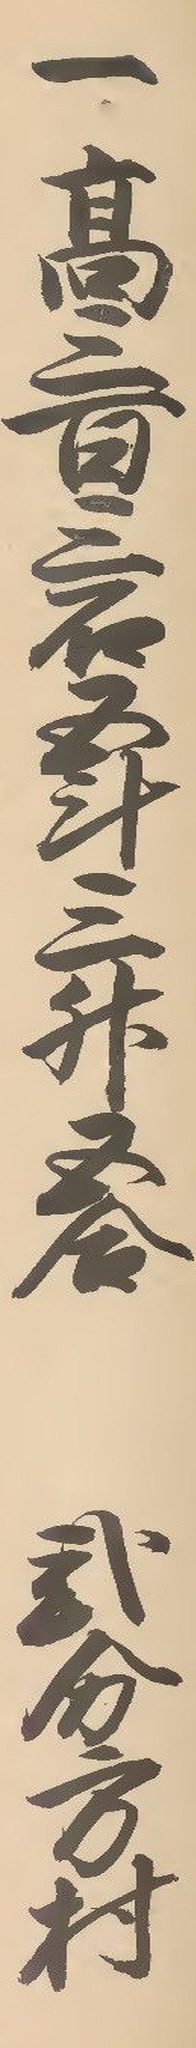一高三百三石五斗三升五合弐分方村
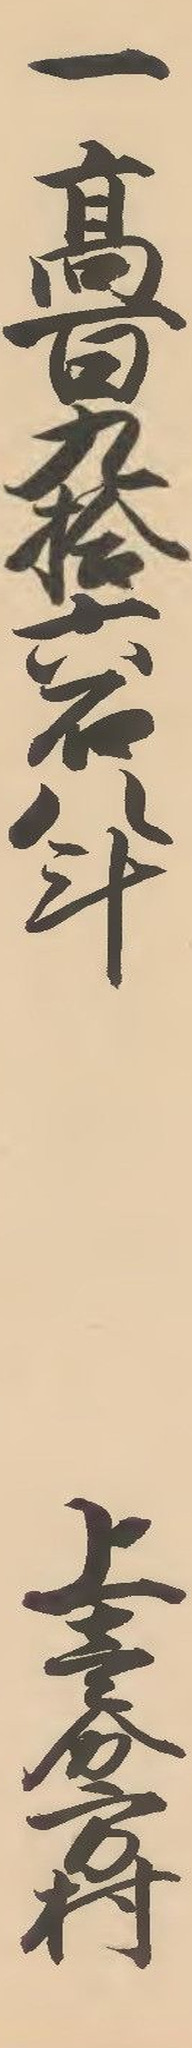一高百九拾六石八斗上壱分方村
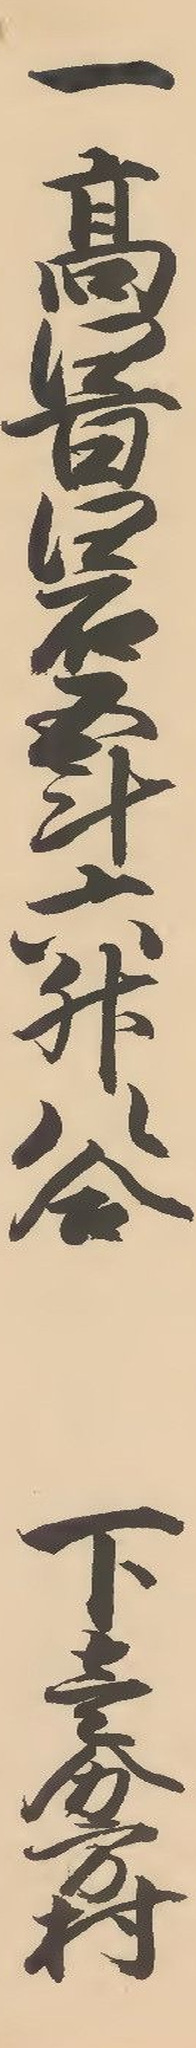一高四百四石五斗六升八合下壱分万村
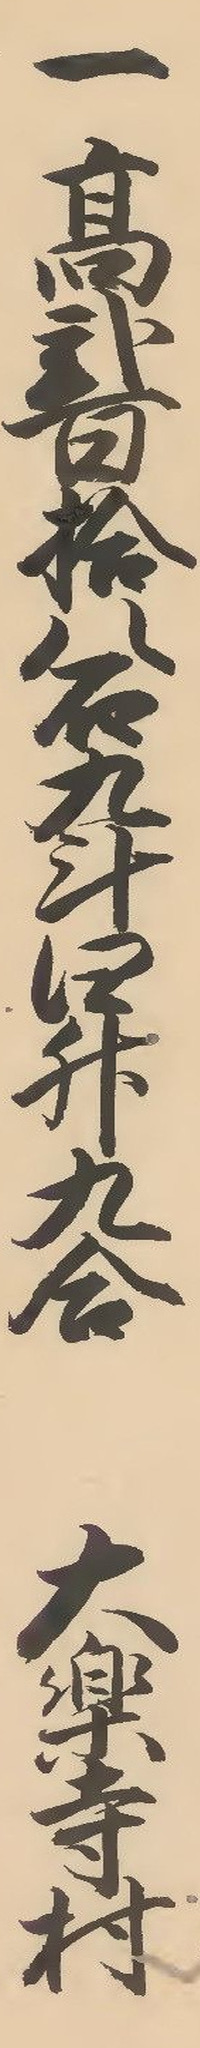一高弐百拾八石九斗四升九合大楽寺村

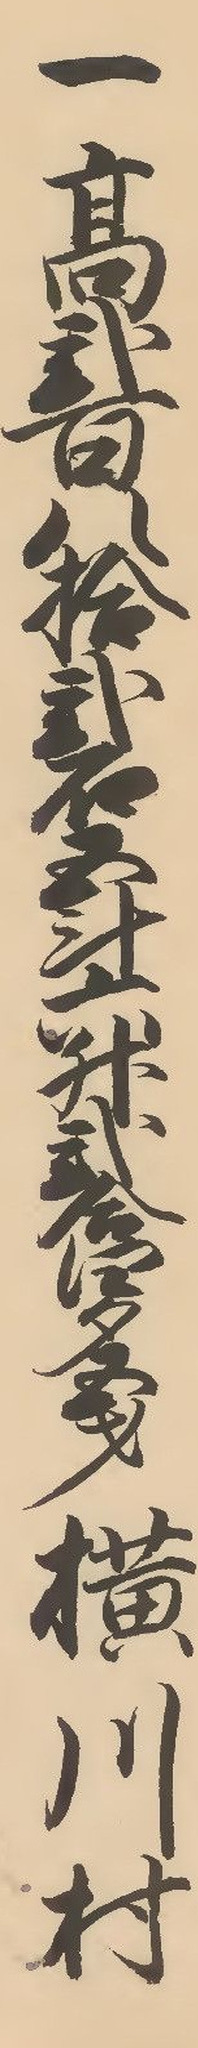一高弐百八拾弐石五斗六升弐合四勺五才横川村
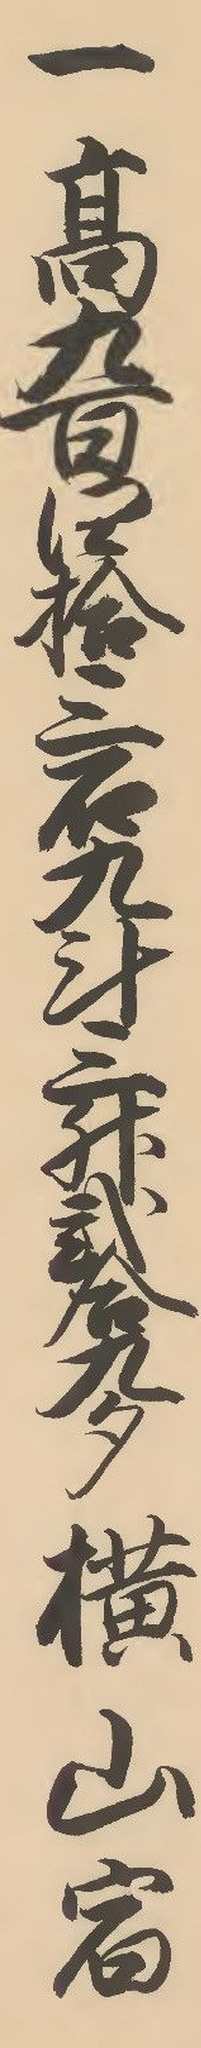一高九百四拾三石九斗三升弐合九勺横山宿
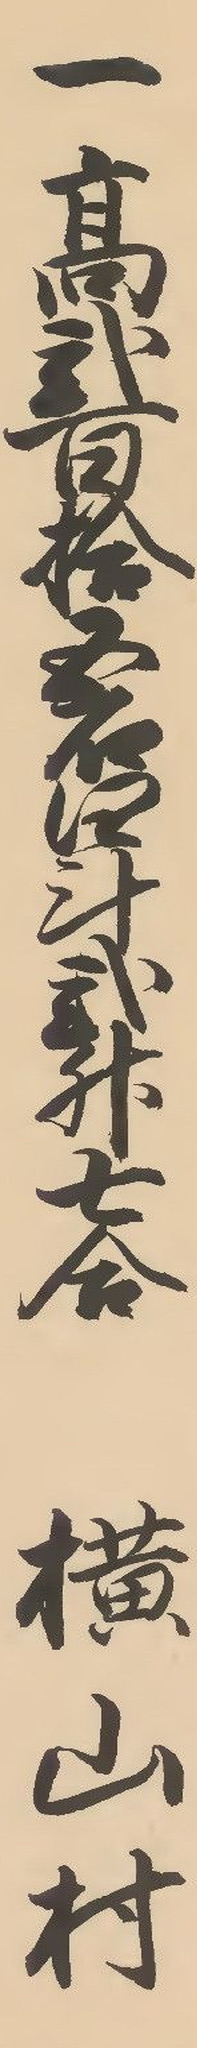一高弐百拾五石四斗弐升七合横山村
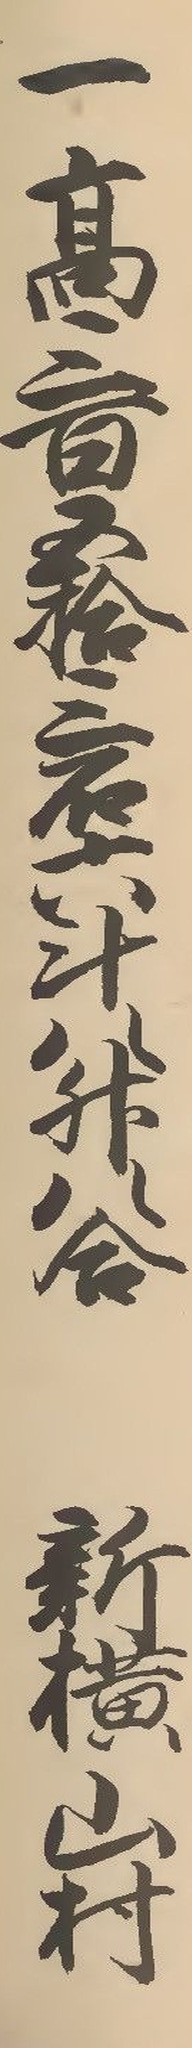一高三百五拾三石六斗八升八合新横山村
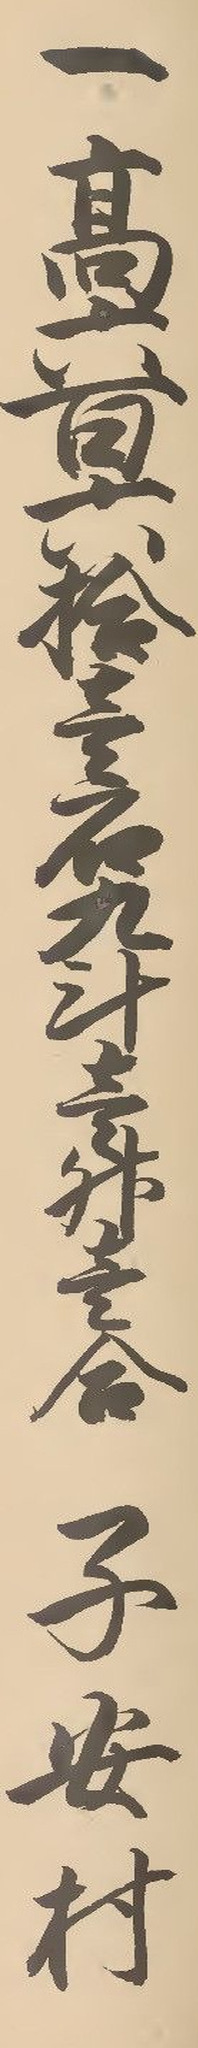一高六百六拾壱石九斗壱升壱合子安村
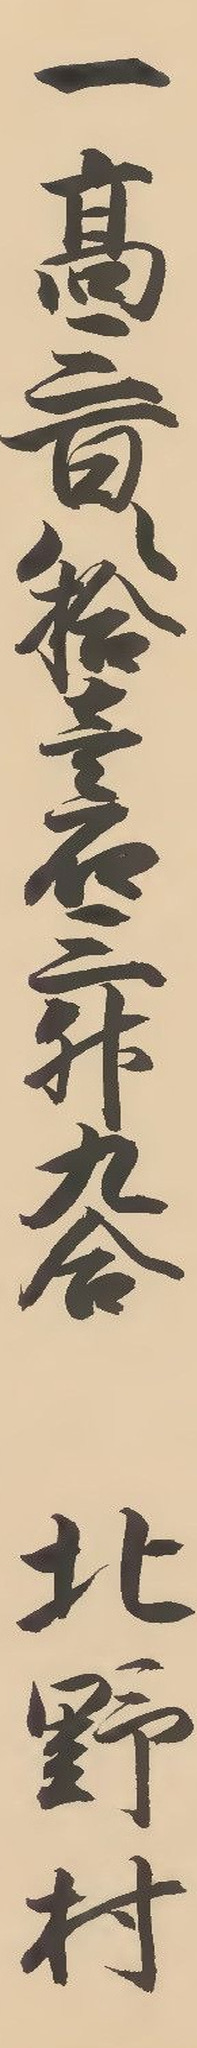一高三百八拾壱石三升九合北野村
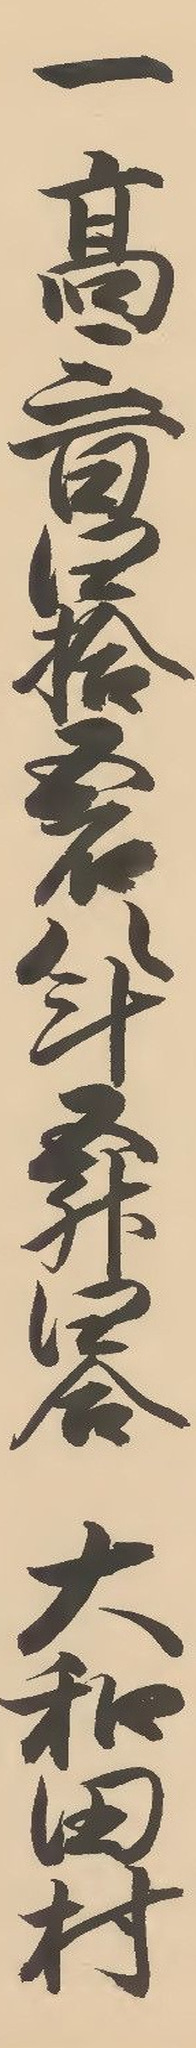一高三百四拾五石八斗五升四合大和田村
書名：武蔵国郷帳　上
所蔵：国立公文書館 National Archives of Japan
